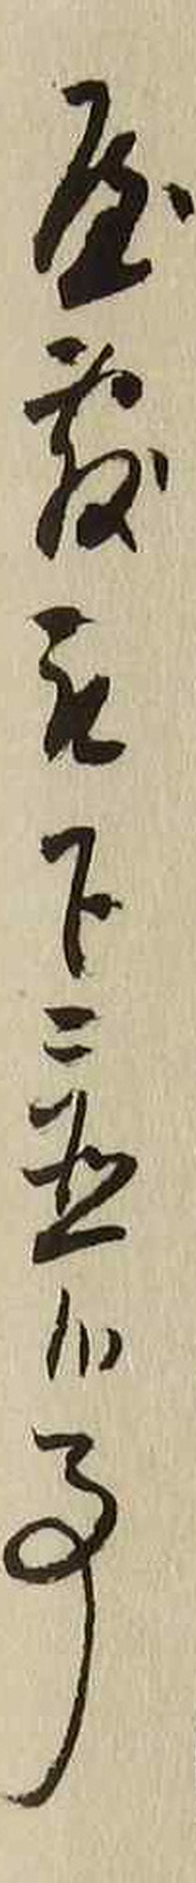屋敷被下置候事
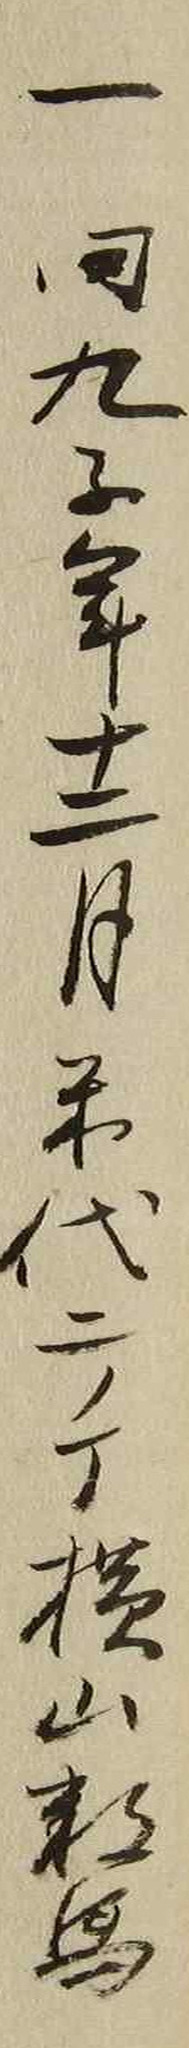一同九子年十二月米代二ノ丁横山数馬
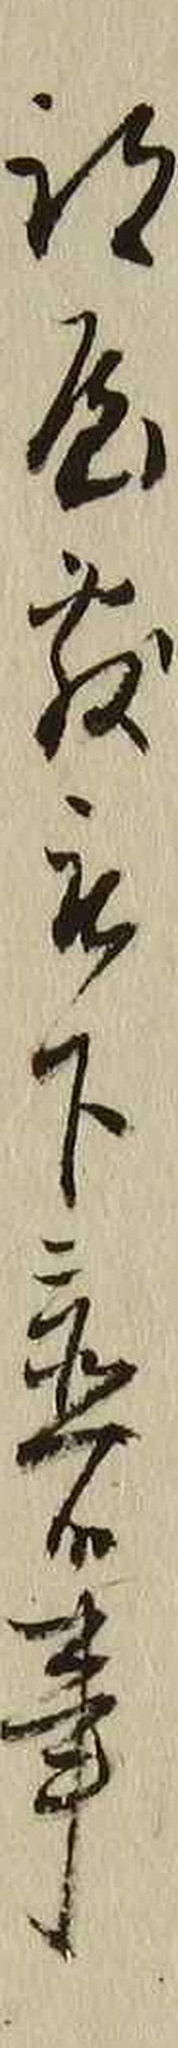跡屋敷被下置候事
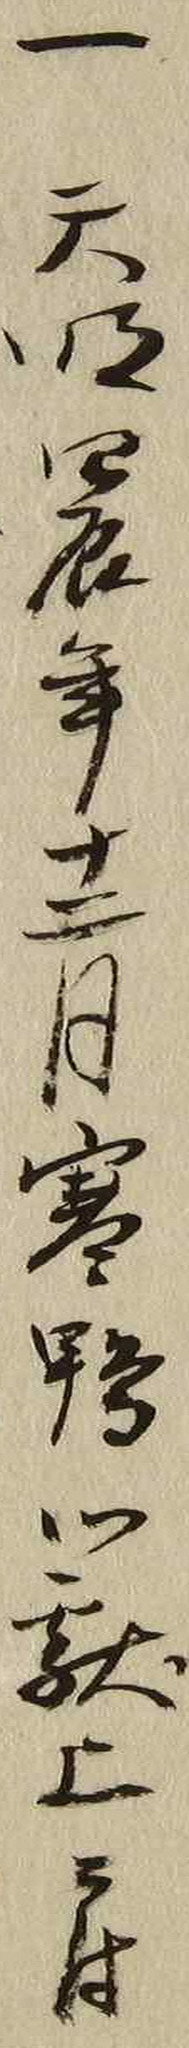一天明四辰年十二月寒鴨御献上ニ付
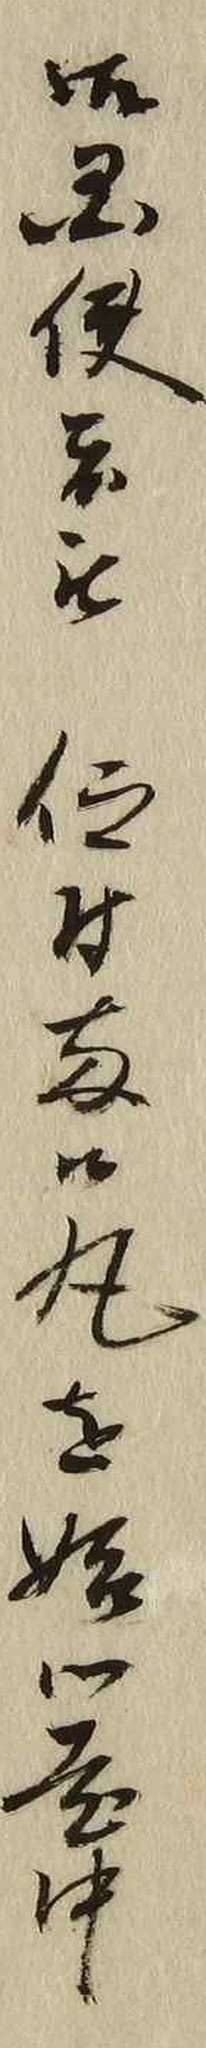御国使者被仰付両御丸を始御老中
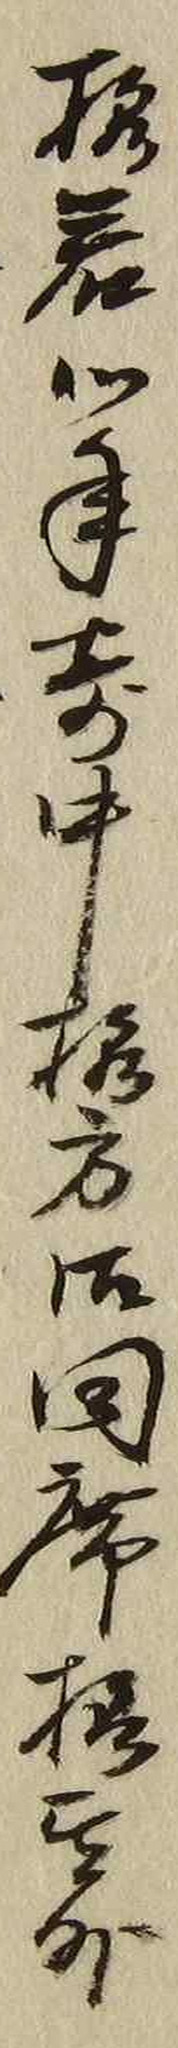様若御年寄中様方御同席様其外
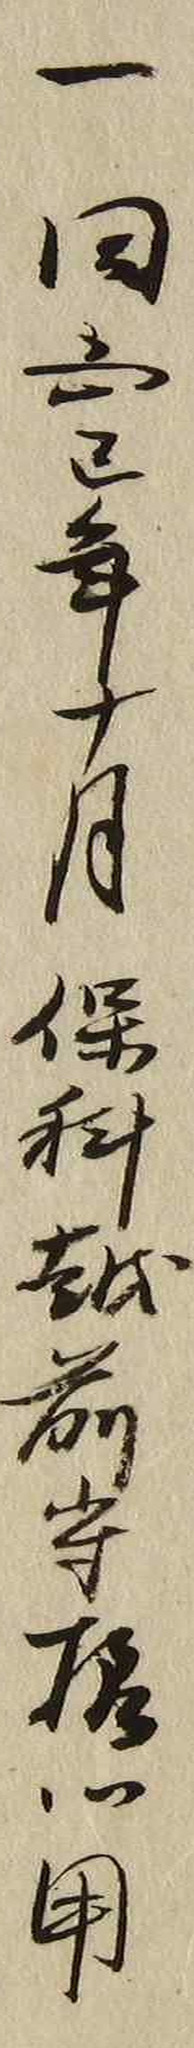一同五巳年十月保科越前守様御用
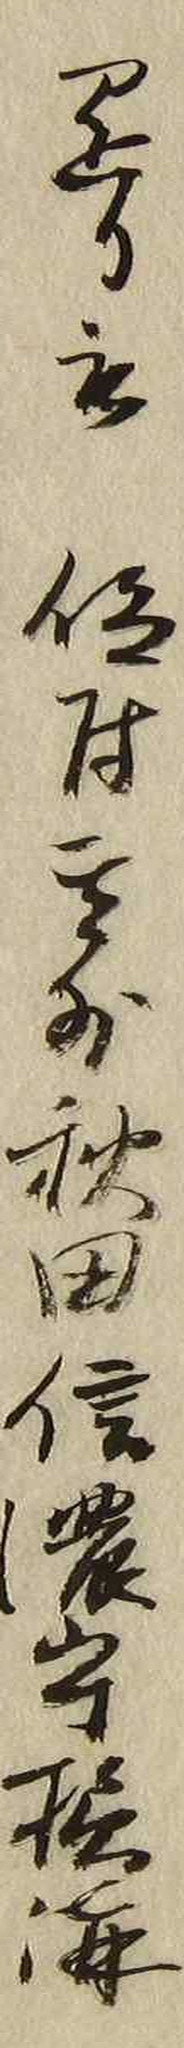懸り被仰付其外秋田信濃守様溝
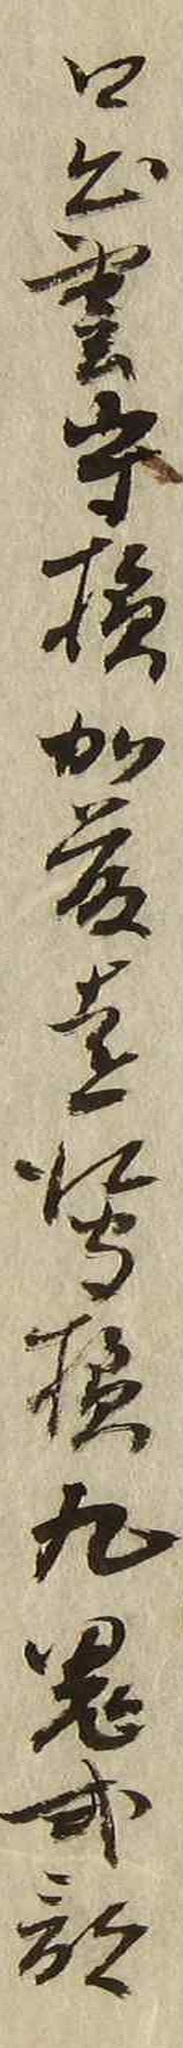口出雲守様加藤遠江守様九鬼式部
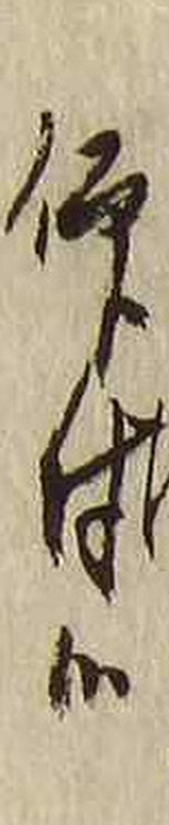仰付候
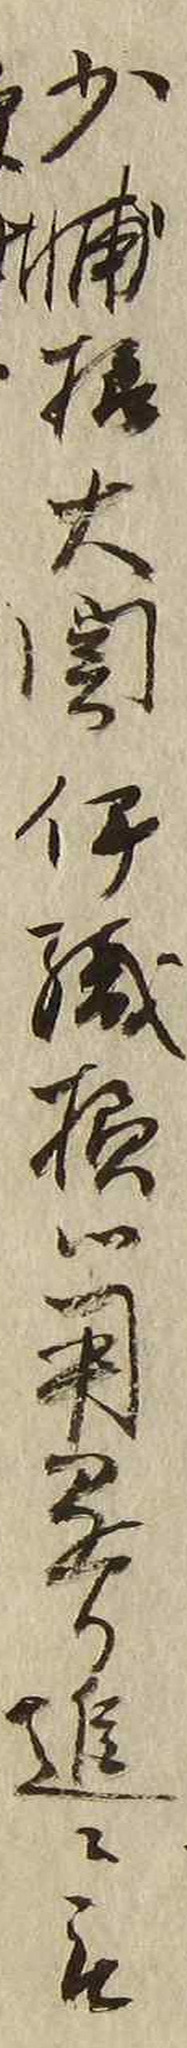少輔様大関伊織様御用懸り追々被

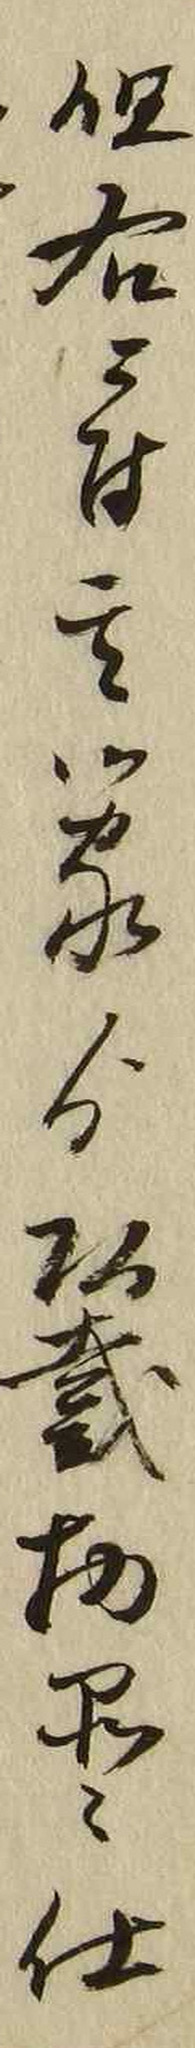但右ニ付其御家ゟ頂戴物品々仕
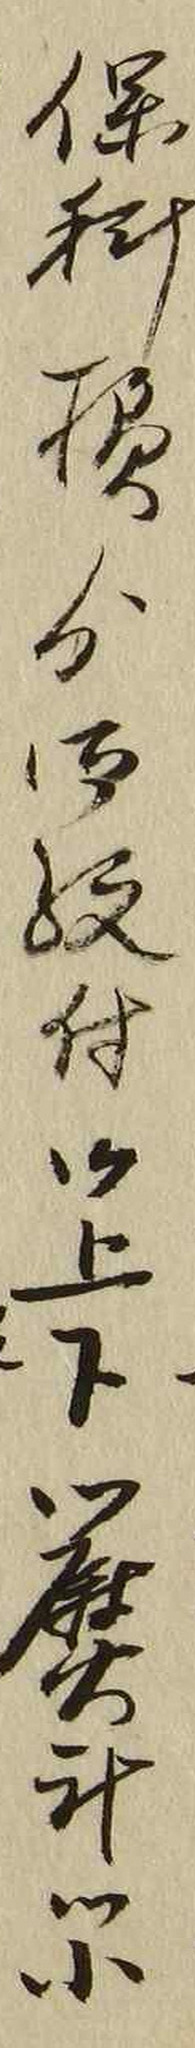保料様ゟ御紋付御上下御熨斗御小
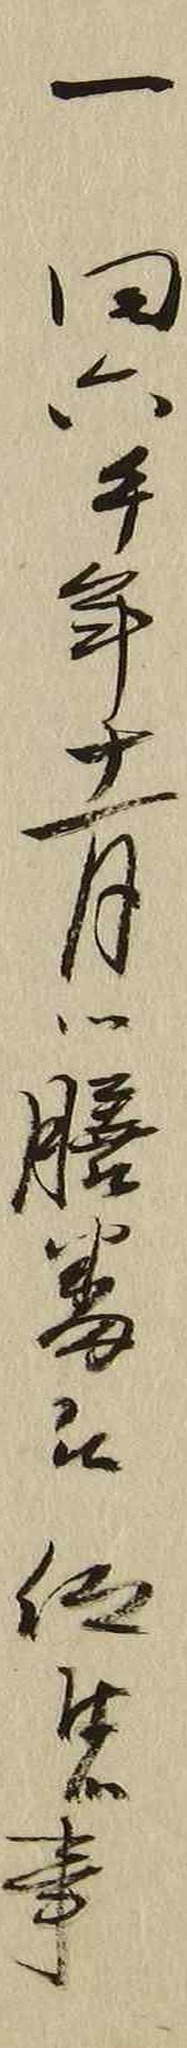一同六午年十一月御膳番被仰付候事
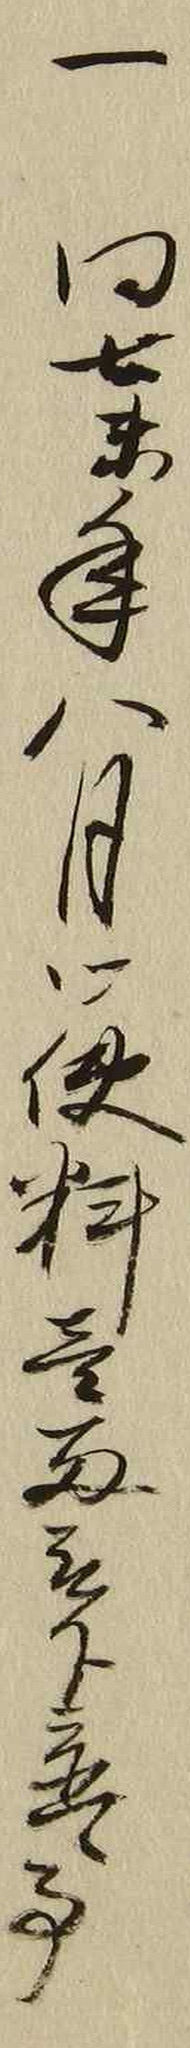一同七未年八月御使料壱両被下置候事
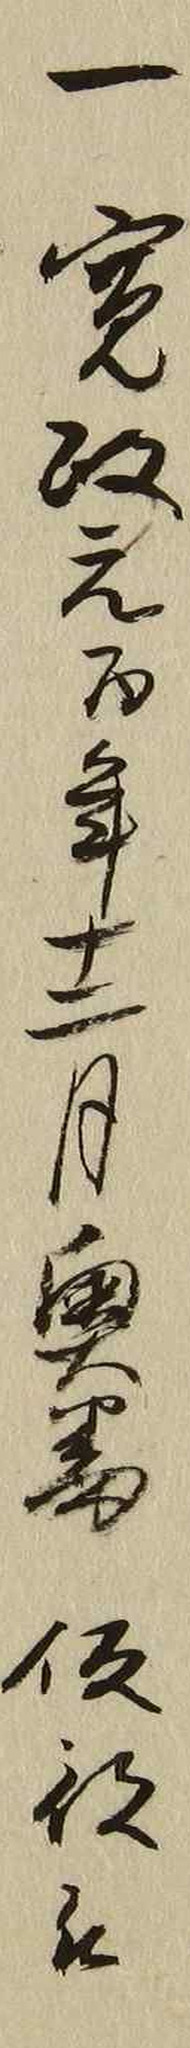一寛政元酉年十二月奥番仮役被
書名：諸士系譜　巻之345　も之部1
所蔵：会津若松市立会津図書館
